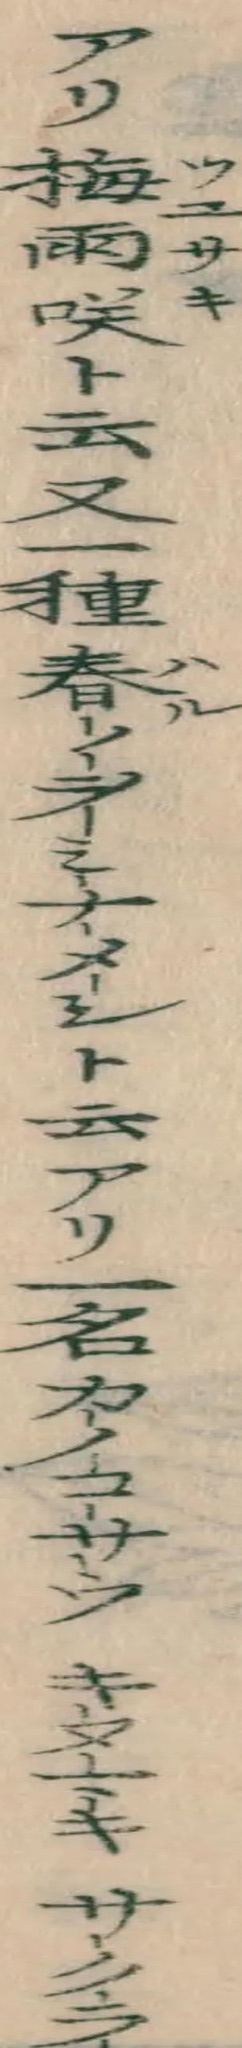アリ梅雨咲ト云又一種春-ノ-ヲ-ミ-ナ-メ-シト云アリ一名カ-ノ-コ-サ-ウキ-ヌ-マ-キサ-ク-ラ-
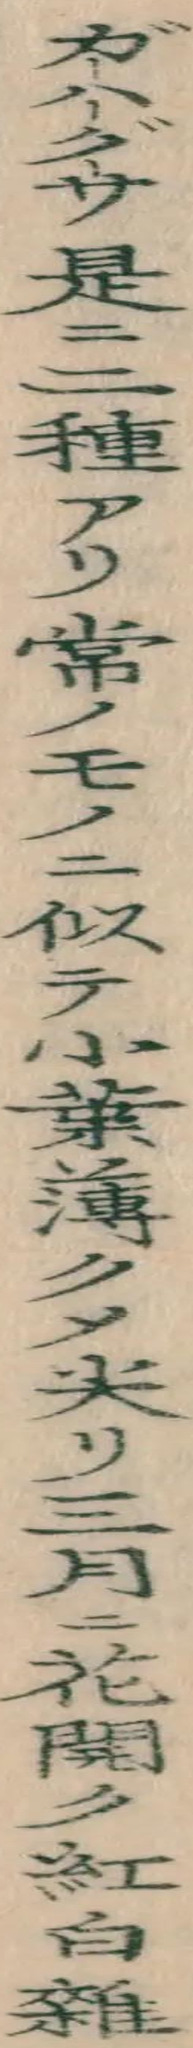ガ-ハ-グ-サ是ニ二種アリ常ノモノニ似テ小葉薄クシテ尖リ三月ニ花開ク紅白雑
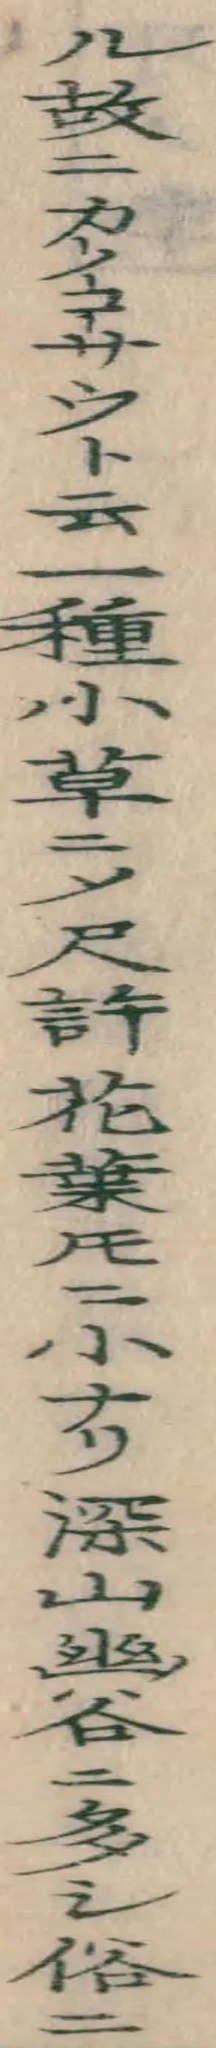ル故ニカ-ノ-コ-サウト云一種小草ニシテ尺許花葉トモニ小ナリ深山幽谷ニ多シ俗ニ
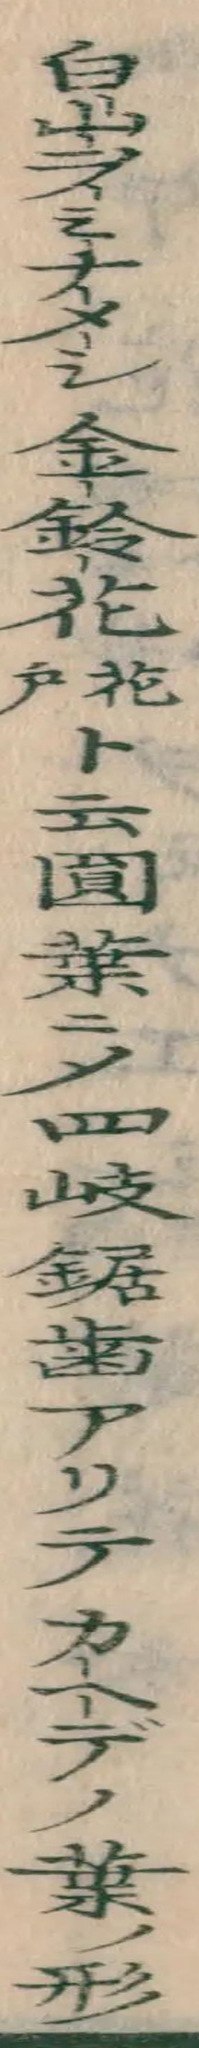白-山-ヲ-ミ-ナ-メ-シ金-鈴-花花戸ト云円葉ニシテ四岐鋸歯アリテカ-ヘ-デノ葉形
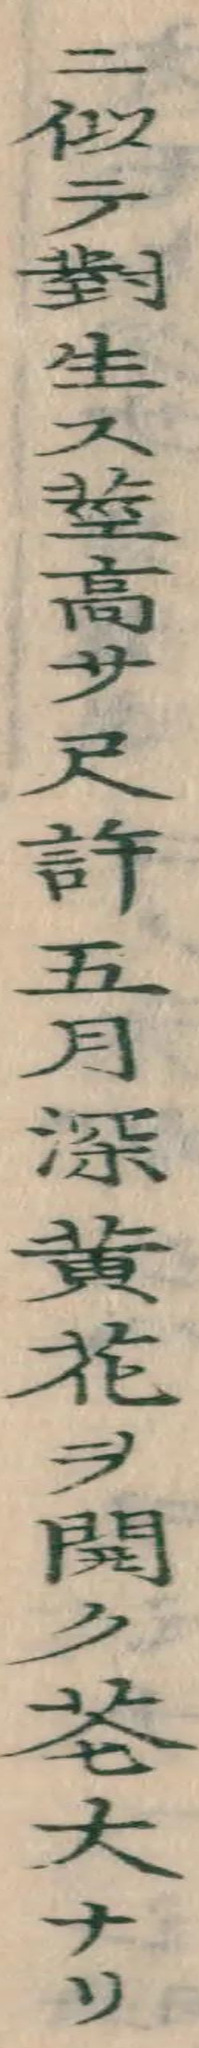ニ似テ対生ス茎高サ尺許五月深黄花ヲ開ク花大ナリ
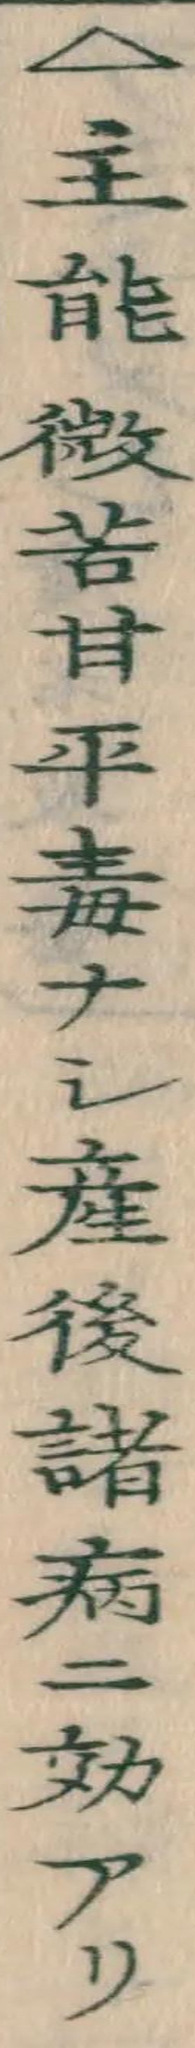△主能微苦甘平毒ナシ産後諸病ニ効アリ

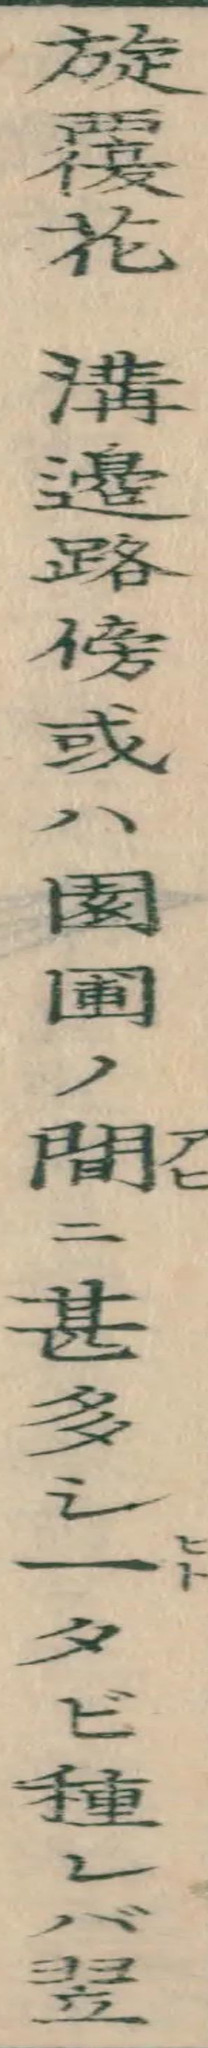旋覆花溝辺路傍或ハ園圃ノ間ニ甚多シ一タビ種レバ翌
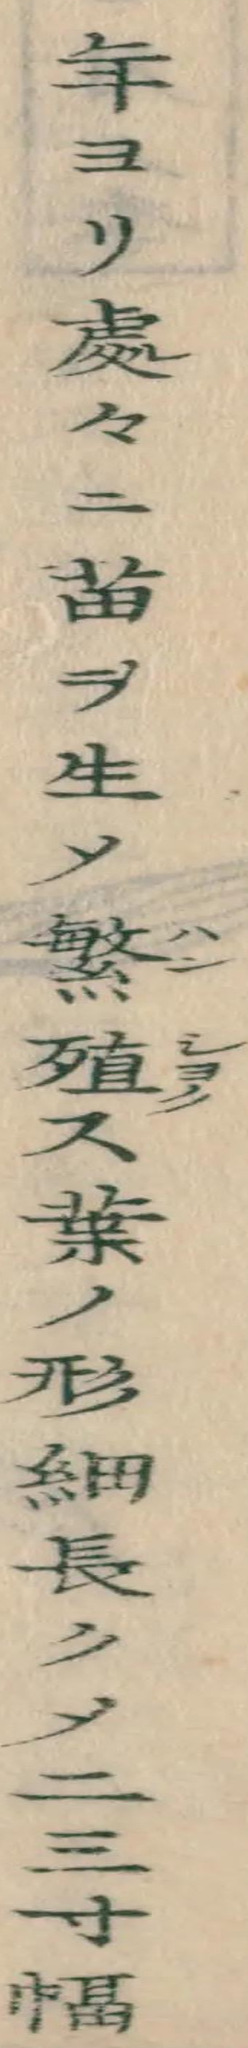年ヨリ処々ニ苗ヲ生シテ繁殖ス葉ノ形細長クシテ二三寸幅
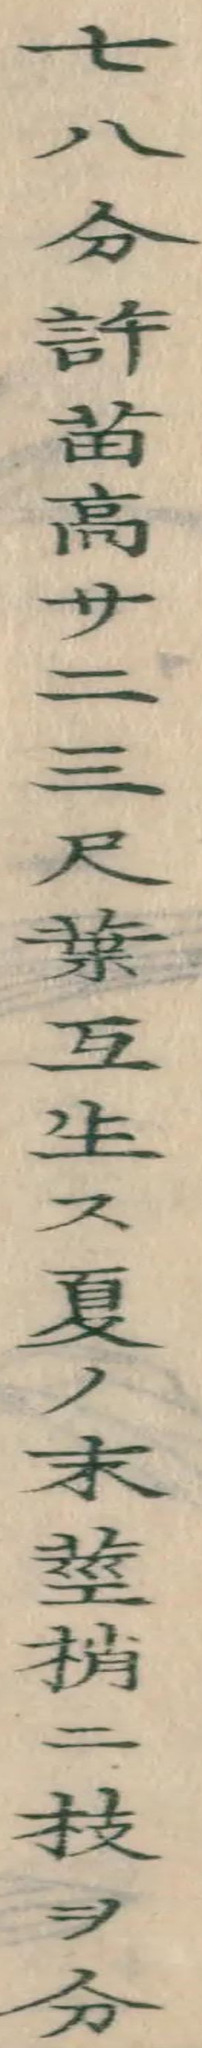七八分許苗高サ二三尺葉互生ス夏ノ末茎梢ニ枝ヲ分
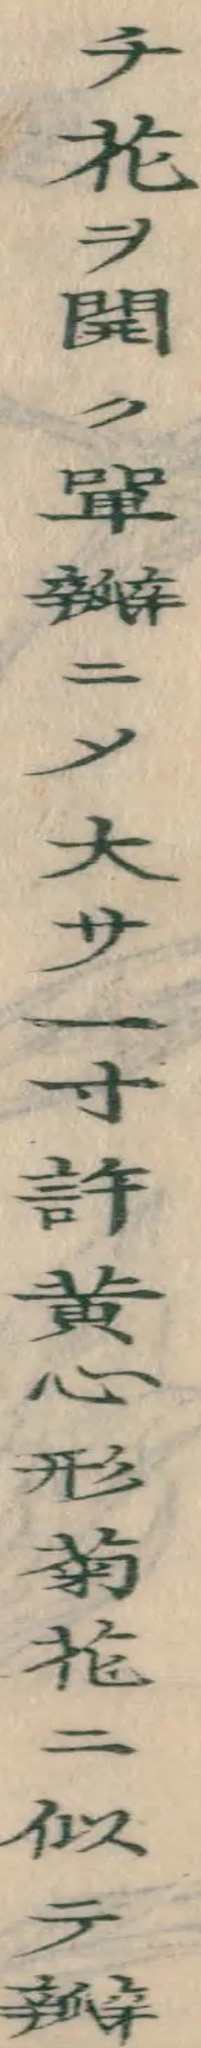チ花ヲ開ク単弁ニシテ大サ一寸許黄心形菊花ニ似テ弁
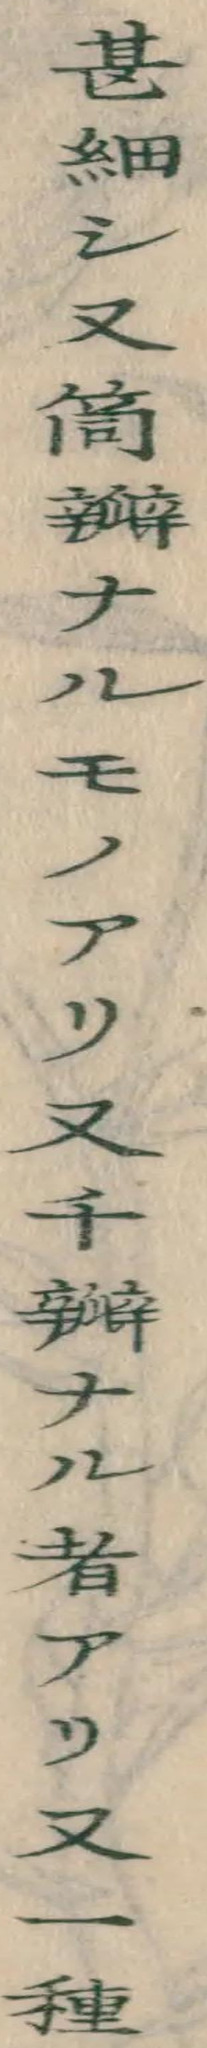甚細シ又筒弁ナルモノアリ又千弁ナル者アリ又一種
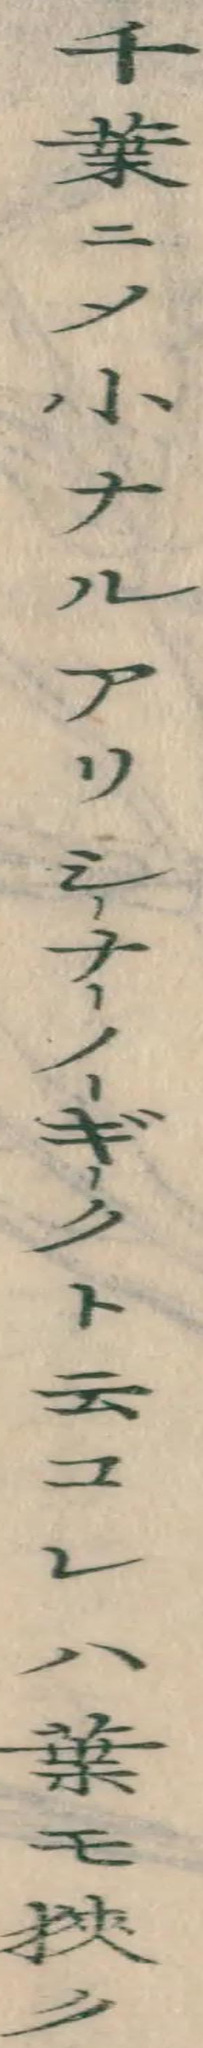千葉ニシテ小ナルアリシ-ナ-ノ-ギ-クト云コレハ葉モ狭ク
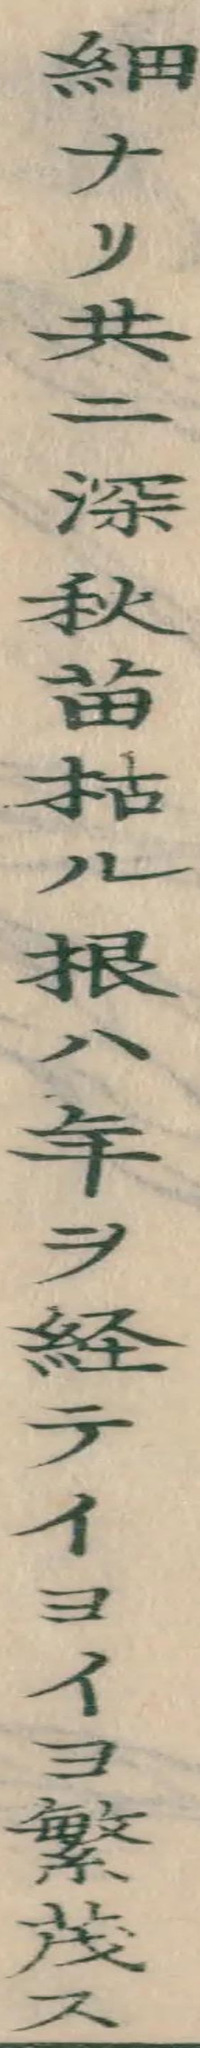細ナリ共ニ深秋苗枯ル根ハ年ヲ経テイヨイヨ繁茂ス
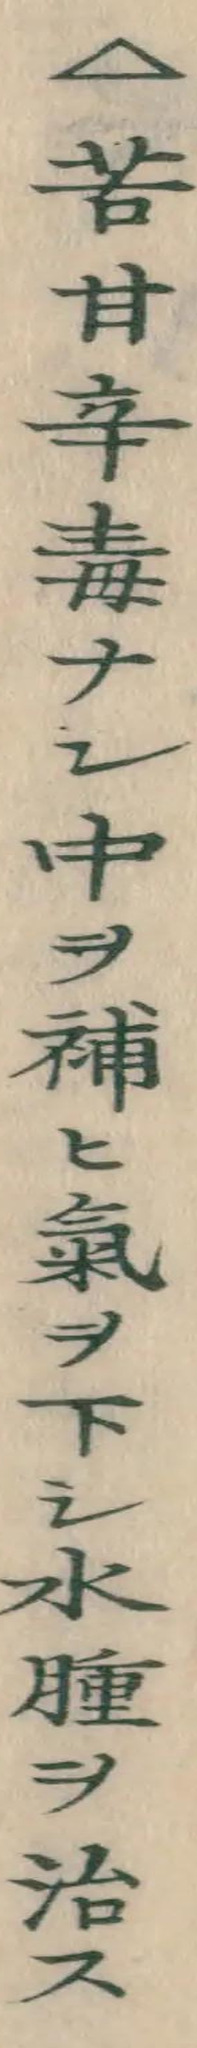△苦甘辛毒ナシ中ヲ補ヒ気ヲ下シ水腫ヲ治ス

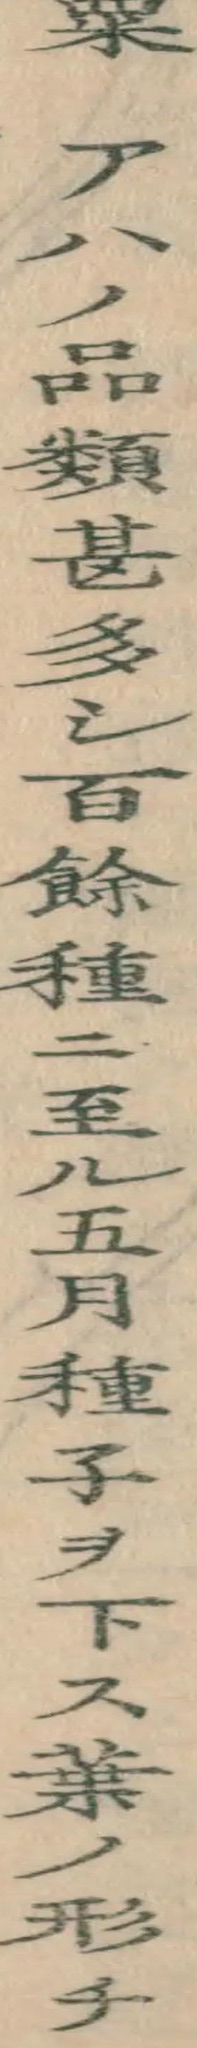粟アハノ品類甚多シ百余種ニ至ル五月種子ヲ下ス葉ノ形チ
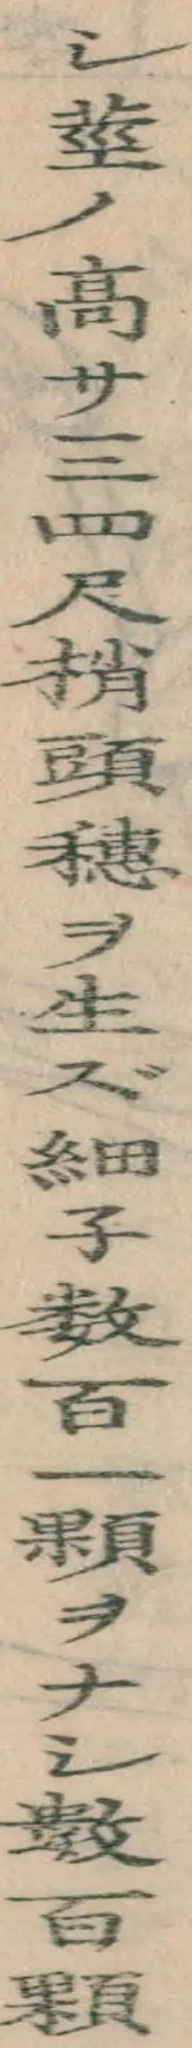シ茎ノ高サ三四尺梢頭穂ヲ生ズ細子数百一顆ヲナシ数百顆
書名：これこれ草 2巻. [2]
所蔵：国立国会図書館 National Diet Library, JAPAN
